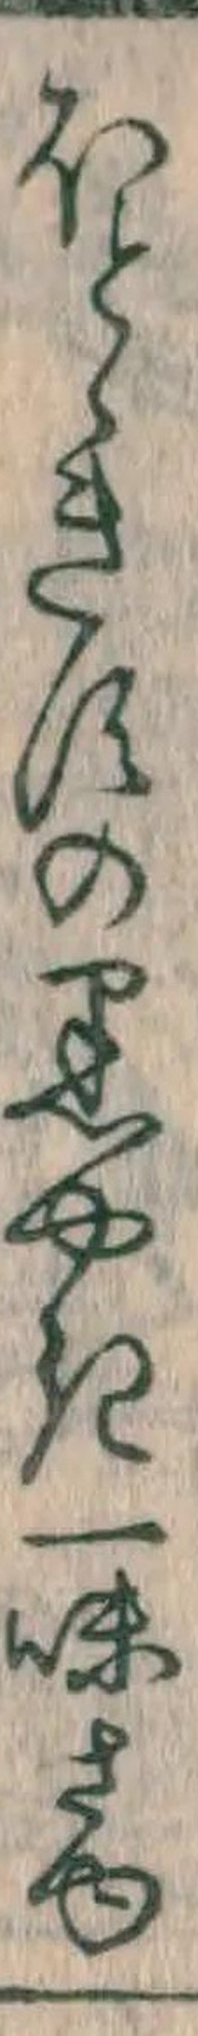ほとゝきすの黒やき一味さゆ
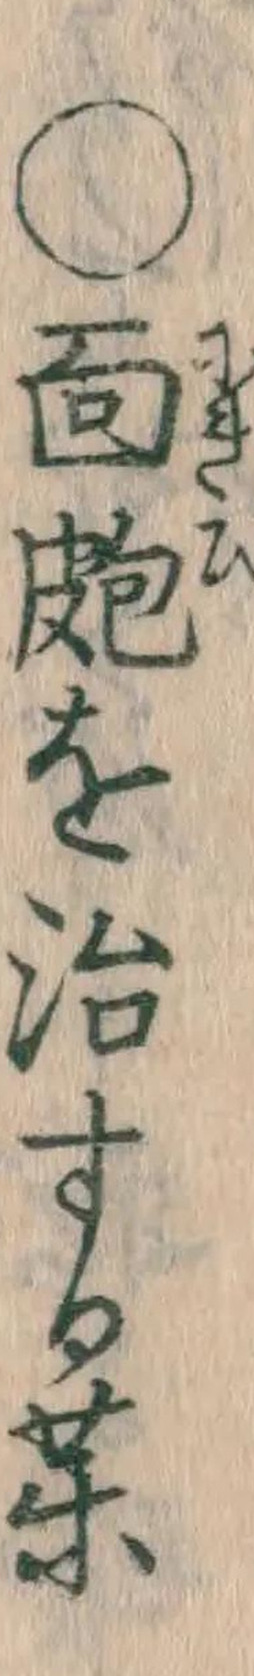○面皰を治する薬
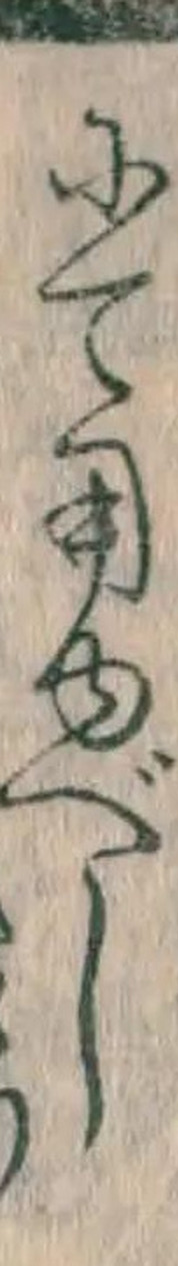にて用ゆべし
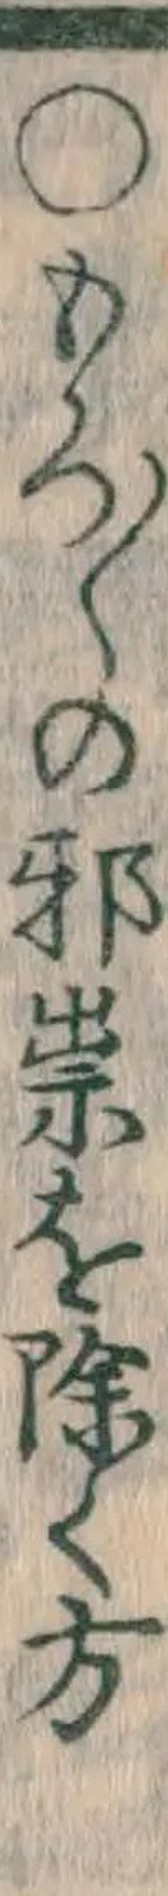○もろ〳〵の邪祟を除く方
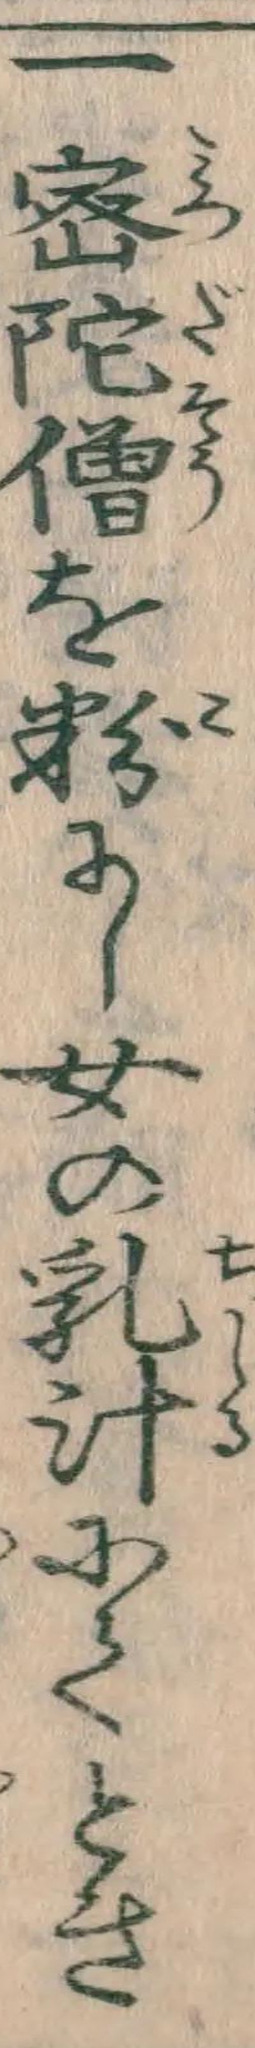一密陀僧を粉にし女の乳汁にてとき
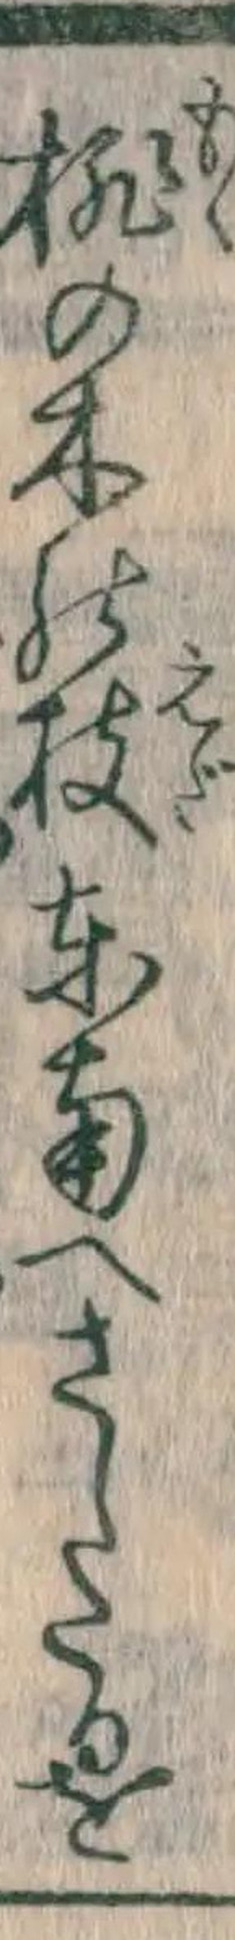桃の木の枝東南へさしたるを
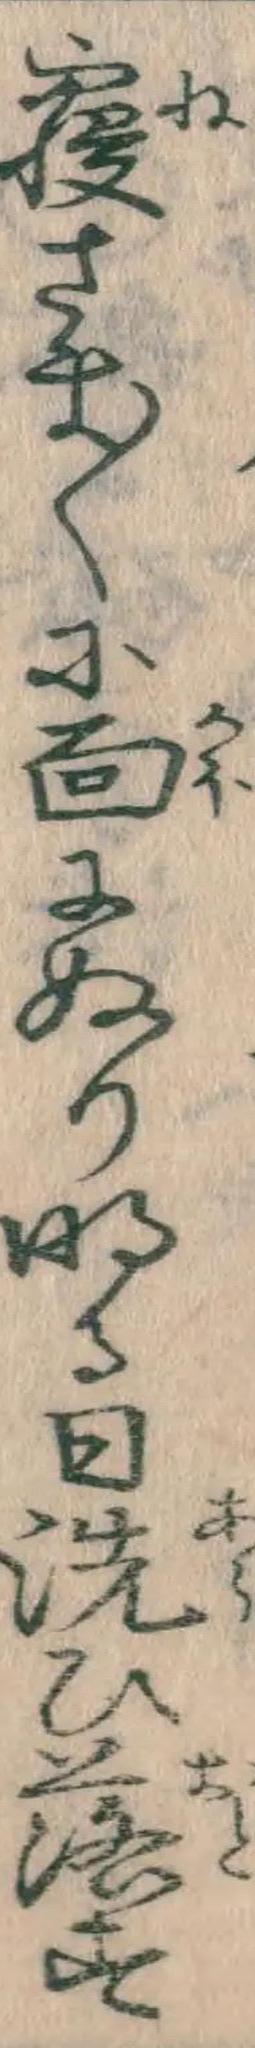寝さま〳〵に面にぬり明る日洗ひ落す
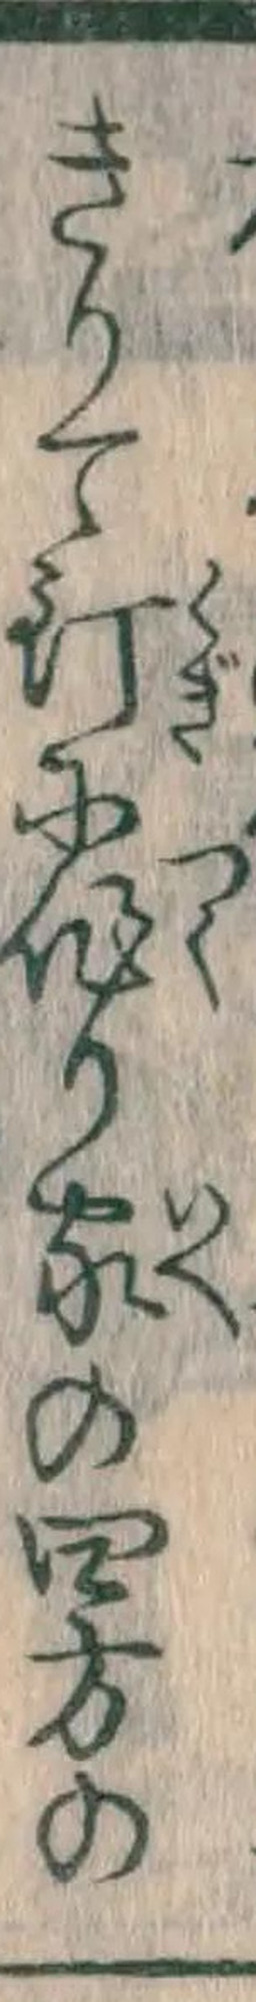きりて釘に作り家の四方の
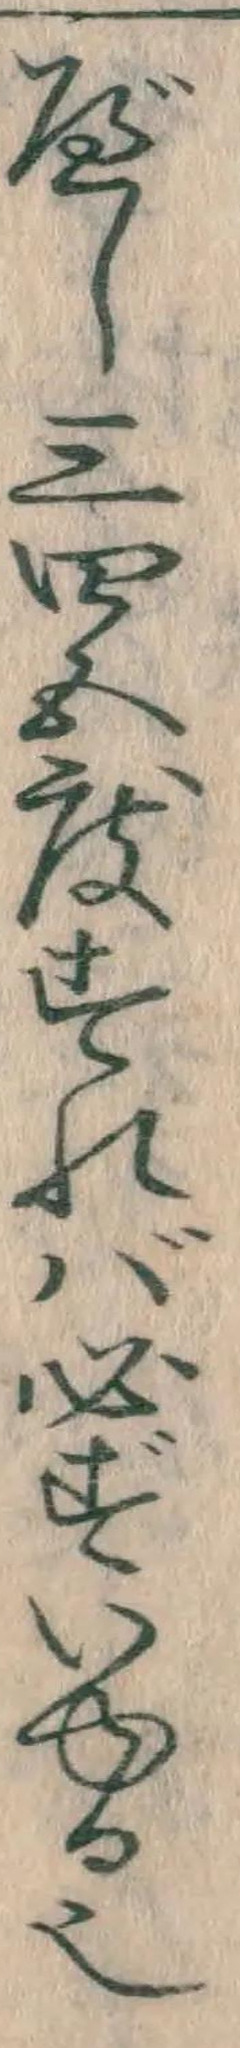べし三四五度すれば必ずいゆる也
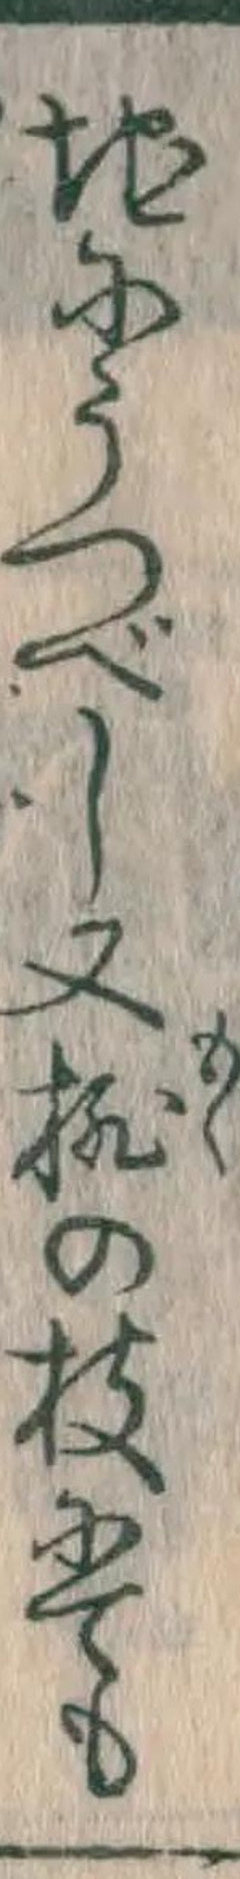地にうつべし又桃の枝にても
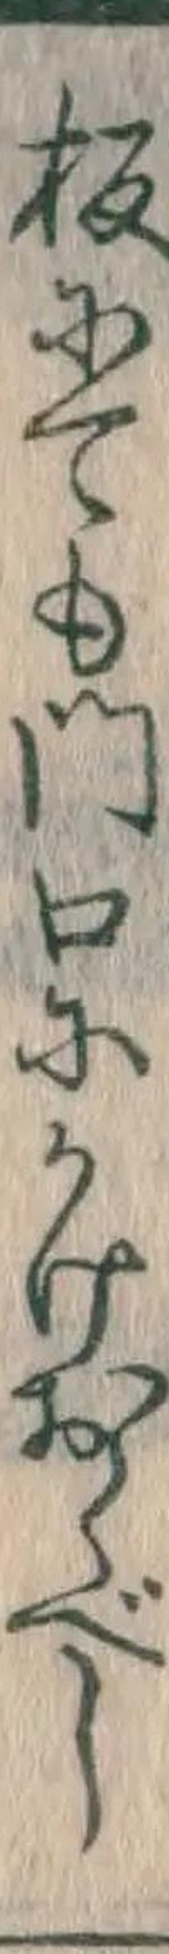板にても門口にかけおくべし
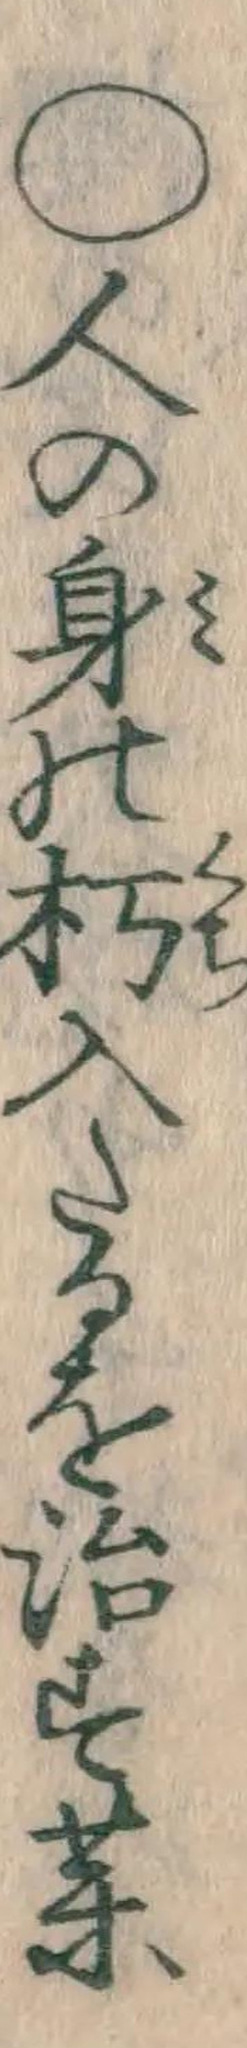○人の身の朽入たるを治す薬
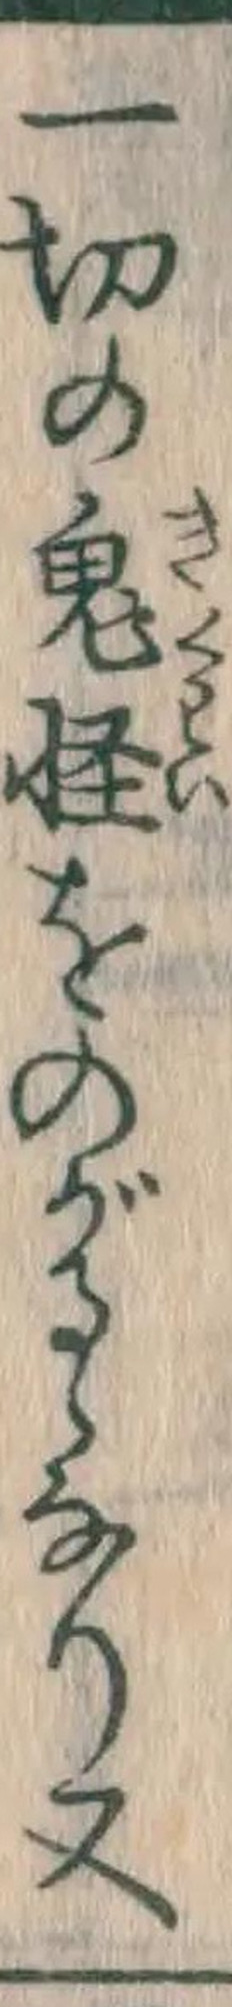一切の鬼怪をのがるゝなり又
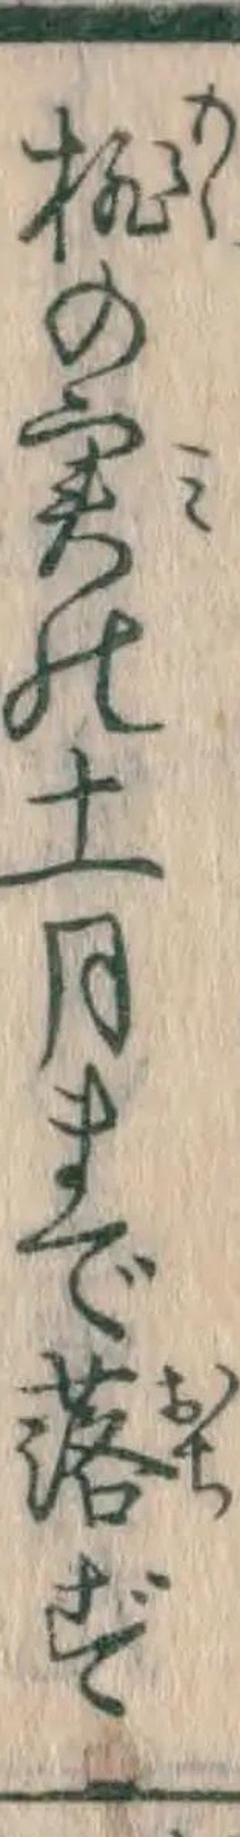桃の実の十一月まで落ず
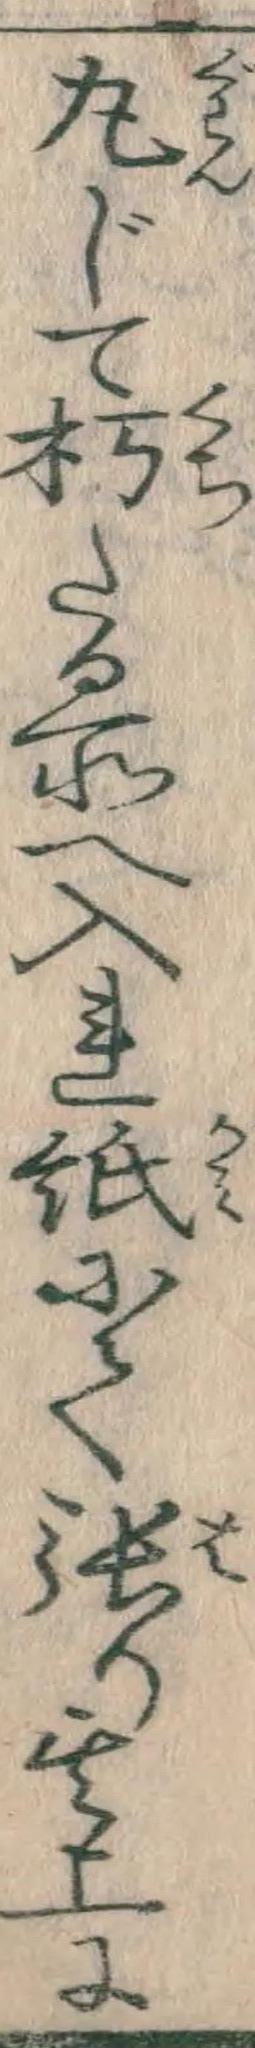丸じて朽たる所へ入れ紙にて張り其上に
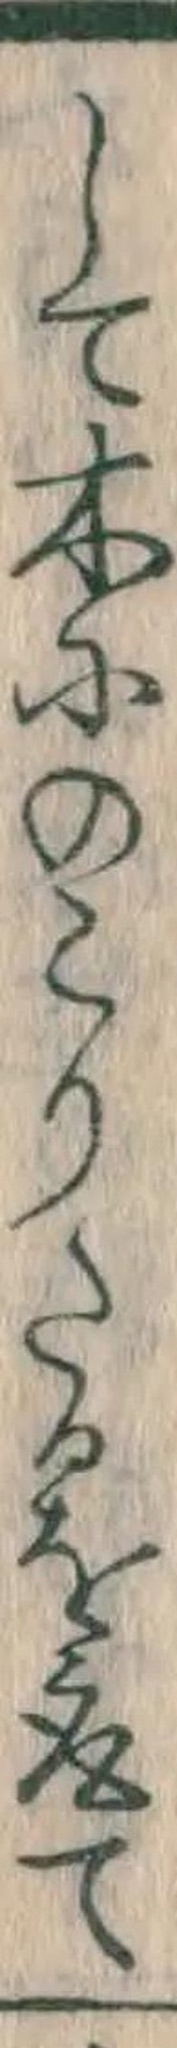して木にのこりたるを取て
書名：広益秘事大全 3巻. [4]
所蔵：国立国会図書館 National Diet Library, JAPAN
